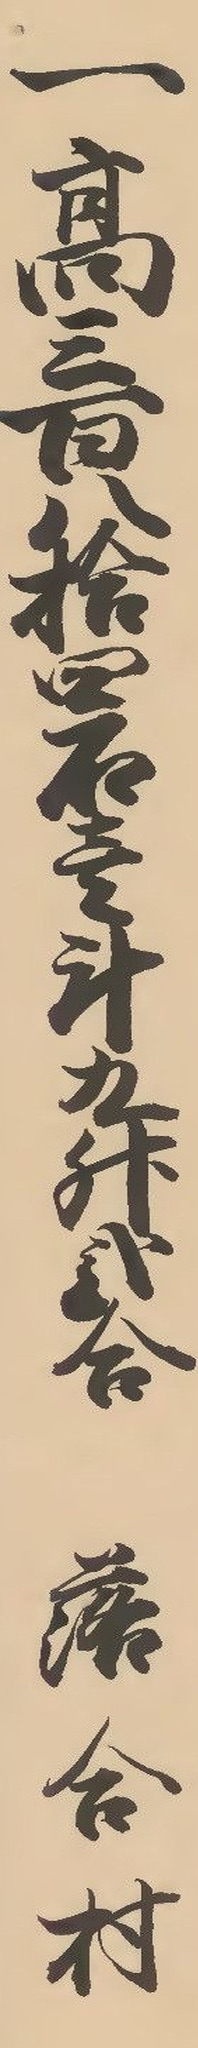一高三百八拾四石壱斗九升弐合落合村
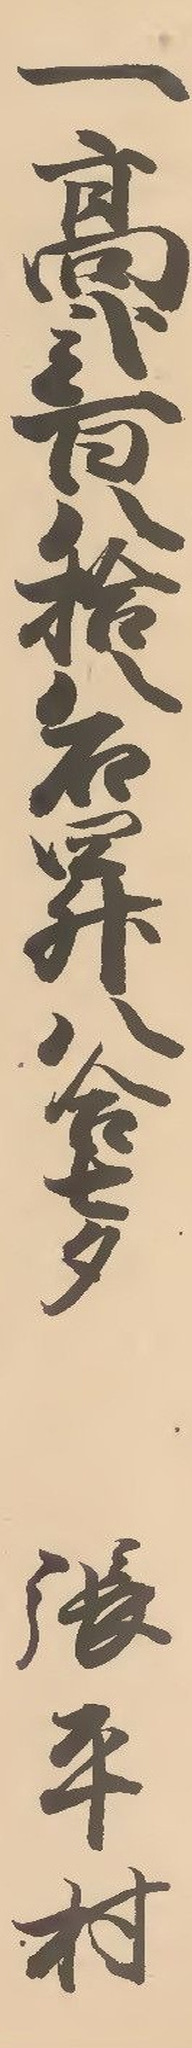一高弐百八拾八石四升八合七勺張平村
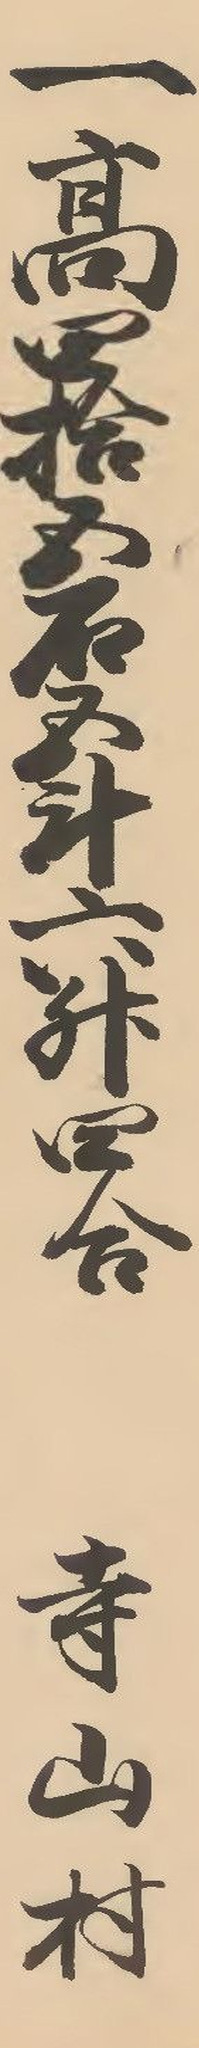一高四拾五石五斗六升四合寺山村
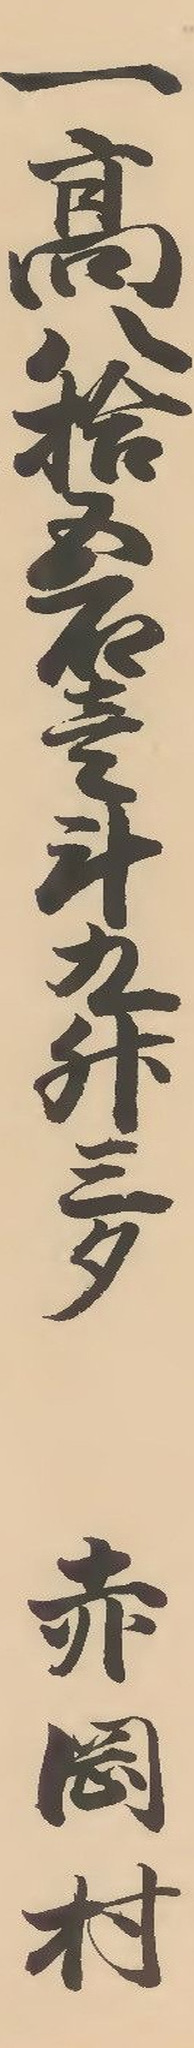一高八拾五石壱斗九升三勺赤岡村
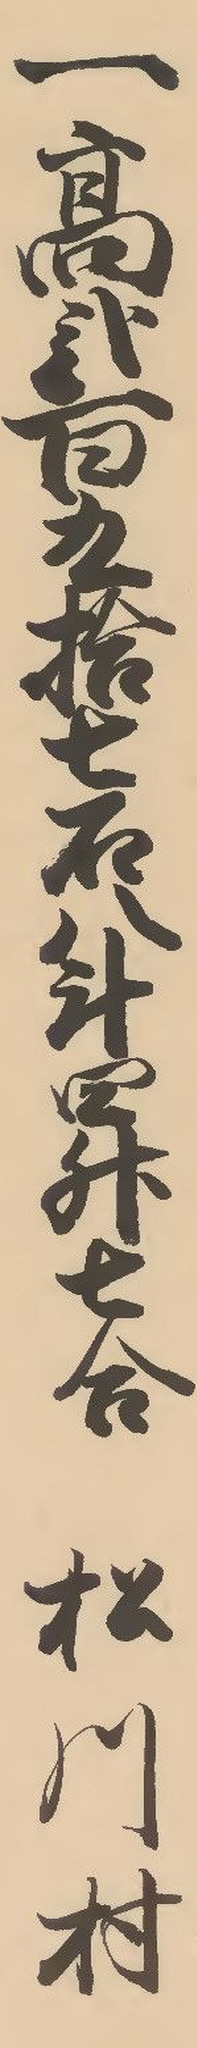一高弐百九拾七石八斗四升七合松川村

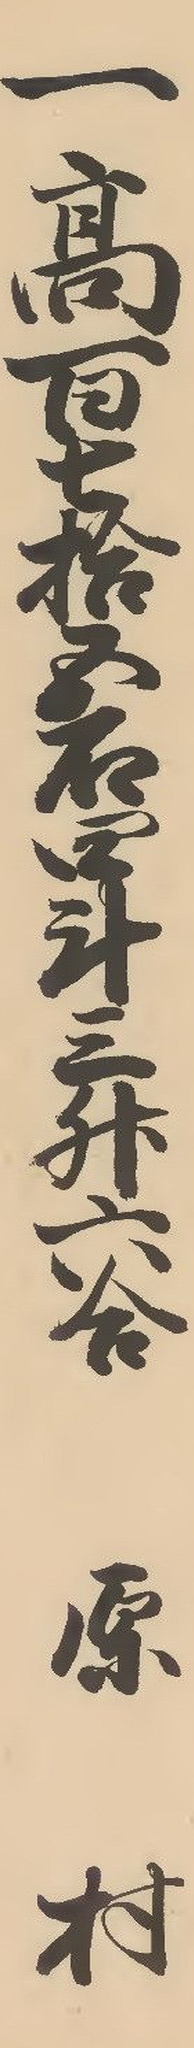一高百七拾五石四斗三升六合原村
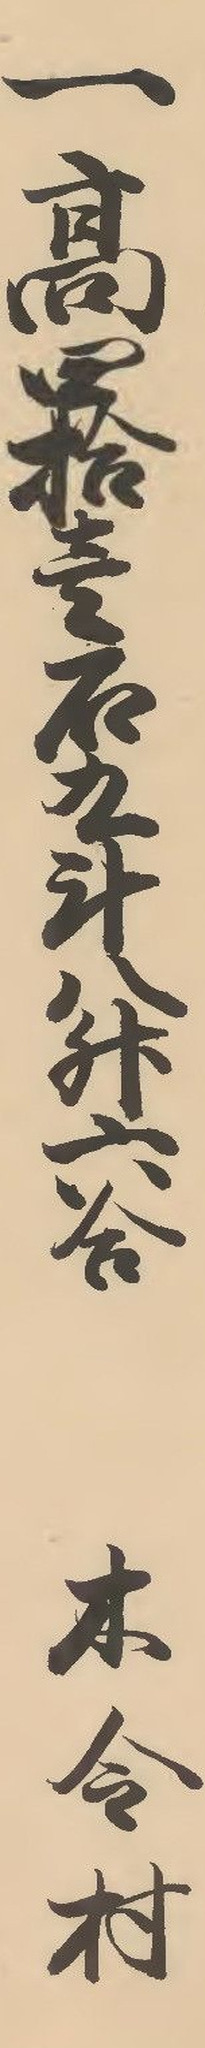一高四拾壱石九斗八升六合木令村
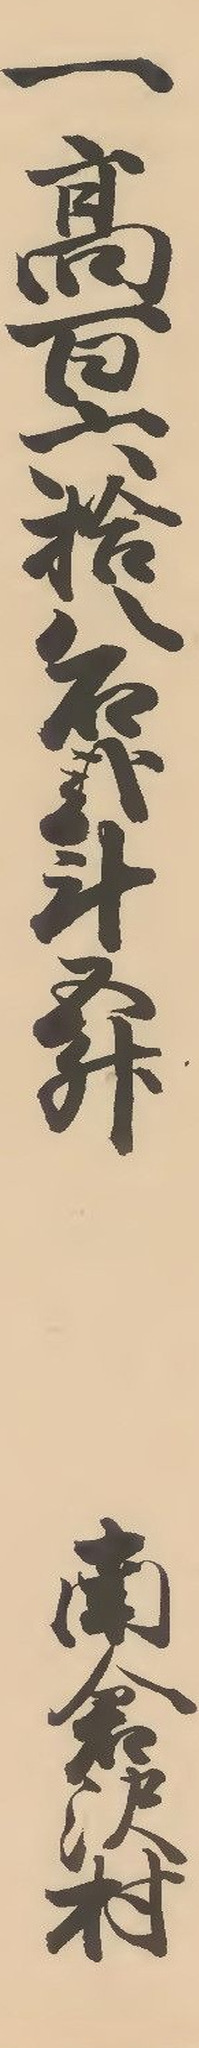一高百六拾八石弐斗五升南倉沢村
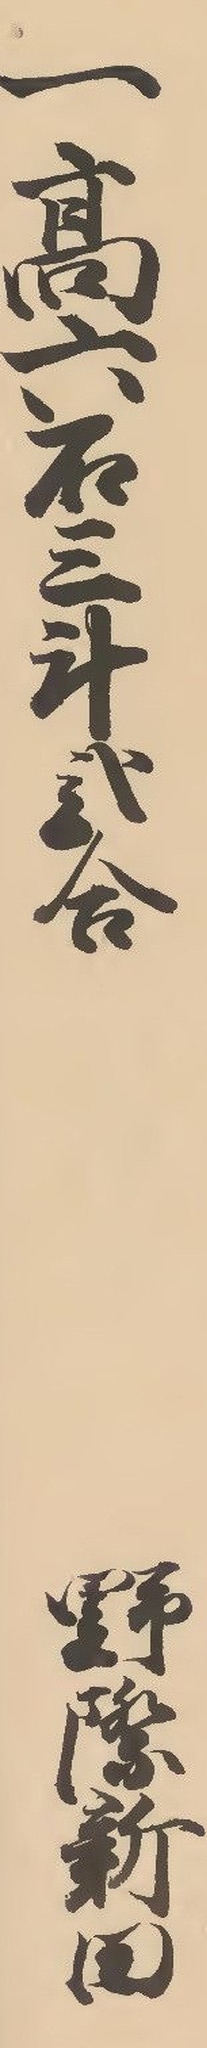一高六石三斗弐合野際新田
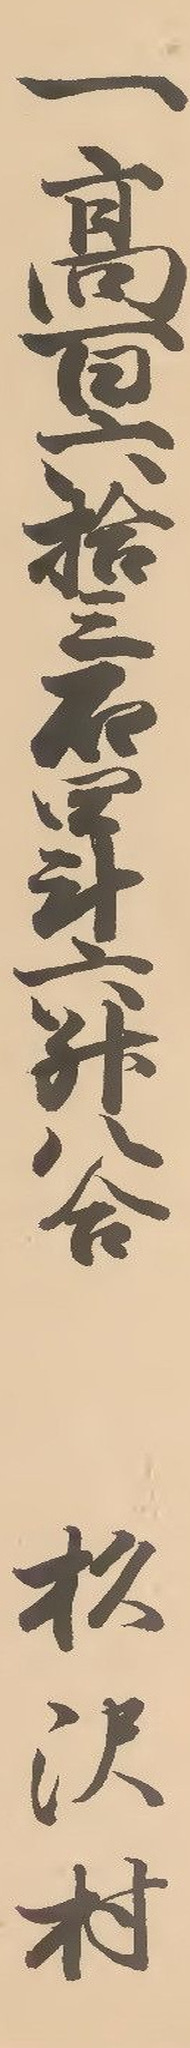一高百六拾三石四斗六升八合杉沢村
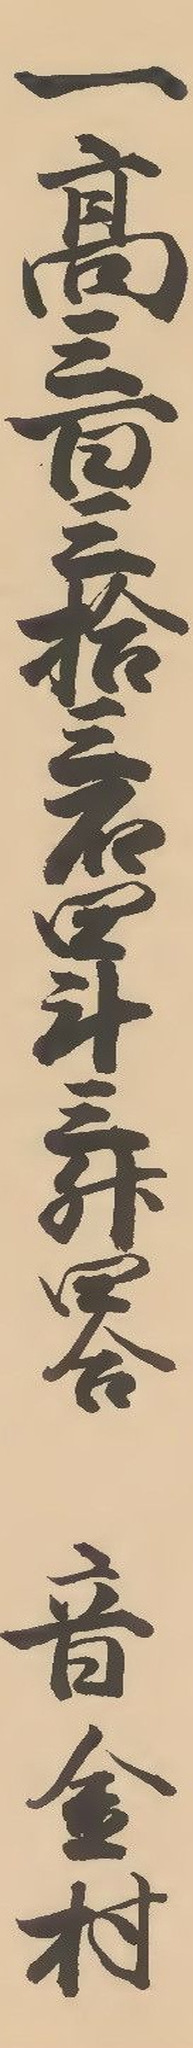一高三百三拾三石四斗三升四合音金村
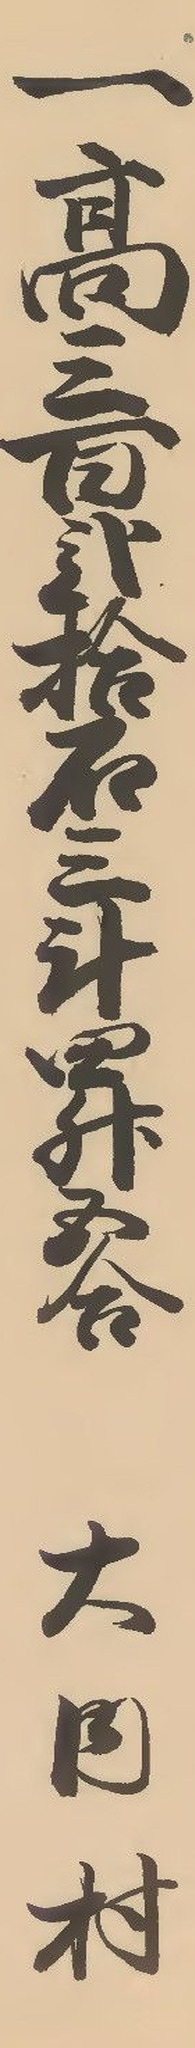一高三百弐拾石三斗四升五合大内村
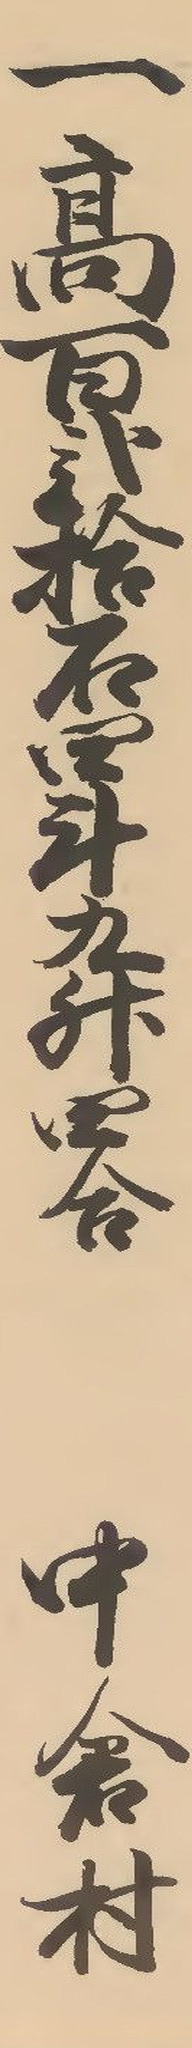一高百弐拾石四斗九升四合中倉村

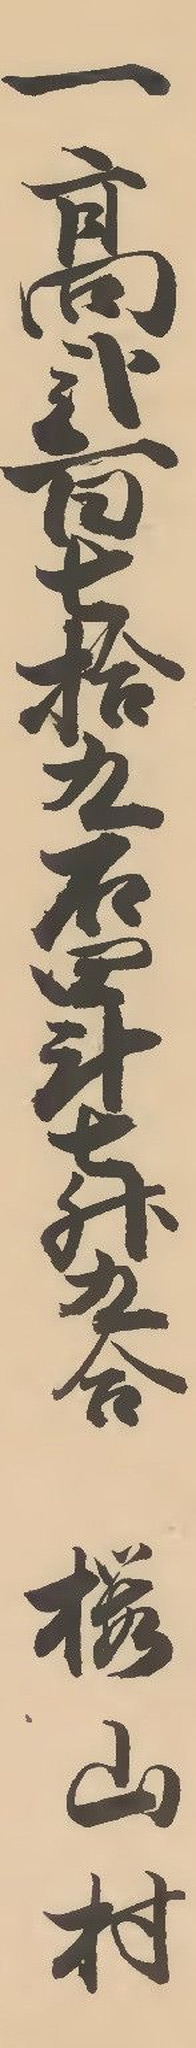一高弐百七拾九石四斗七升九合桜山村
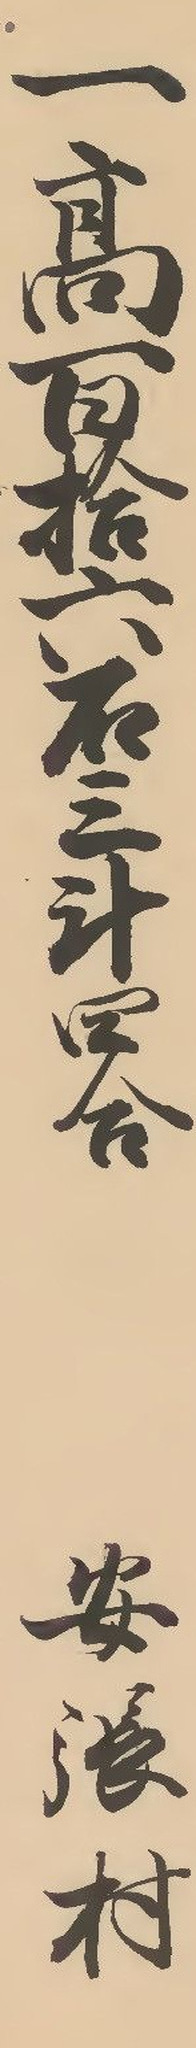一高百拾六石三斗四合安張村
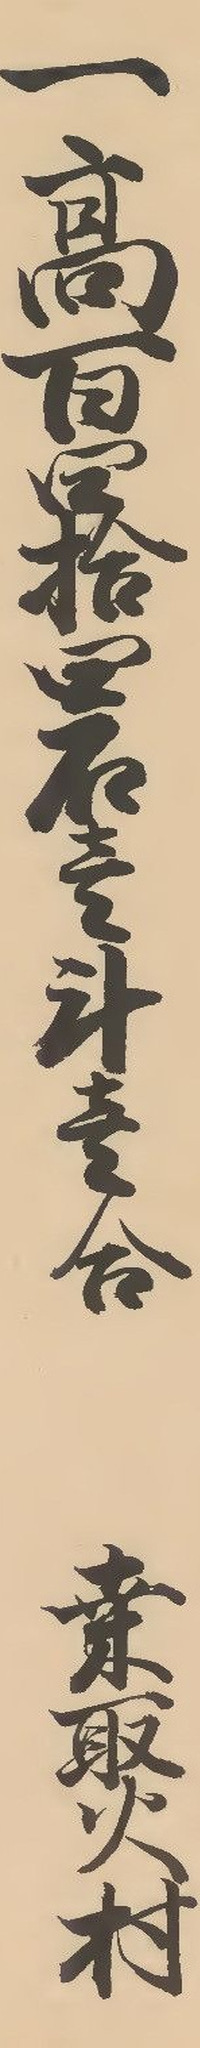一高百四拾四石壱斗壱合桑取火村
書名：陸奥国郷帳　１
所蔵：国立公文書館 National Archives of Japan
